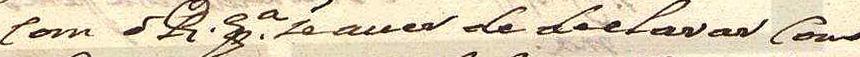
Com o R. E p.a se auer de declarar Com
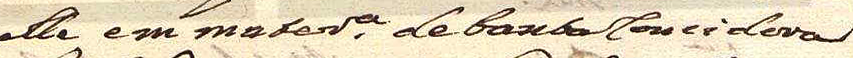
elle em mater.a de tanta Concidera
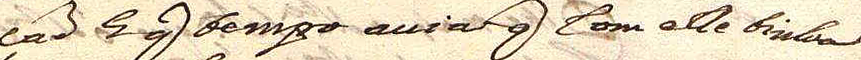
çaõ E q̄ tempo auia q̄ Com elle tinha
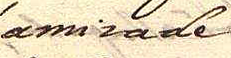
amizade
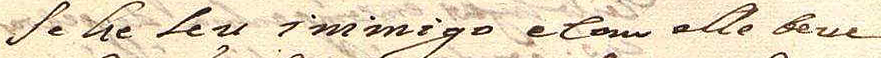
Se he seu inimigo e com elle teue
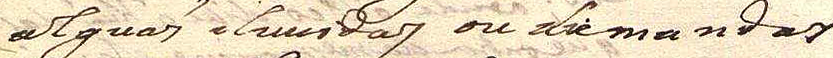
alguas̄ duuidas ou diemandas
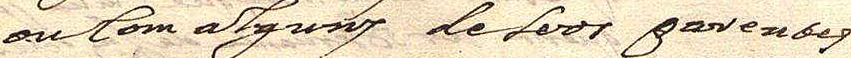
ou Com alguns de seos parentes
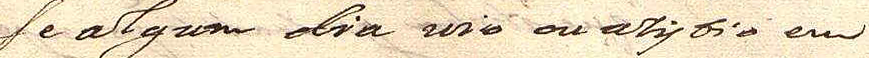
se algum dia uio ou asistio em
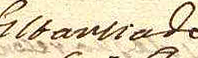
Estansia de
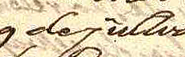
9 de julho
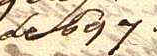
de 697.
